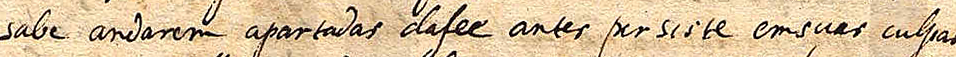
sabe andarem apartadas da fee antes persiste em suas culpas
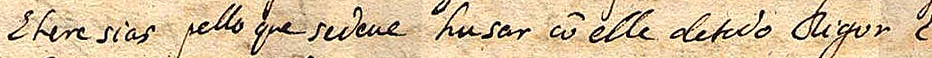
E heresias pello que se deue husar cō elle de todo Rigor E
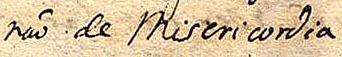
naõ de Misericordia
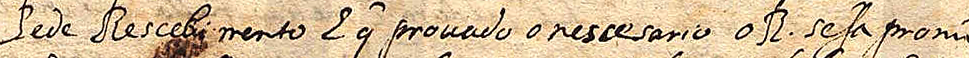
Pede Rescebimento E q̄ prouado o nescesario o R. seJa pronū
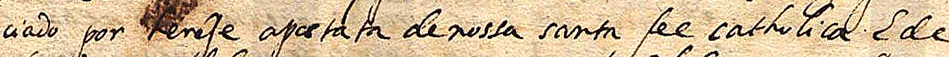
ciado por hereJe apostata de nossa santa fee catholica E de
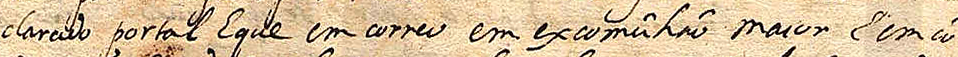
clarado por tal E que emcorreo em excomūhaõ maior E em cō
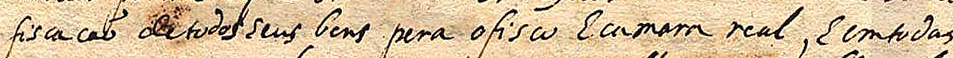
fiscacaõ de todos seus bens pera o fisco E camara real, E com todas
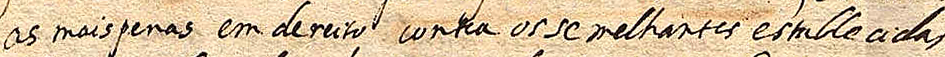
as mais penas em dereito contra os semelhantes establecidas
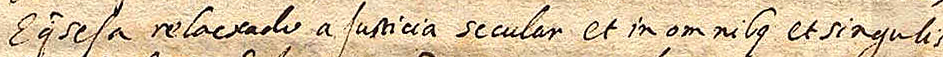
E q̄ seJa relacxado a Justicia secular et in omnibꝯ et singulis
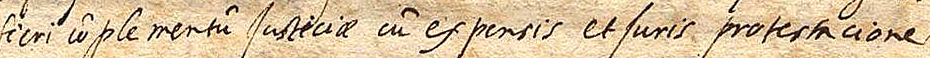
fieri cōplementū Justiciæ cū expensis et Juris protestacione
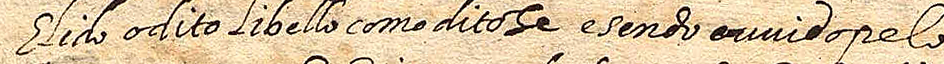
E lido o libello como dito he e sendo ouuido pelo
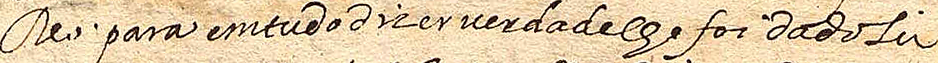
Reo. para em tudo dizer uerdade lhe foi dado Iu
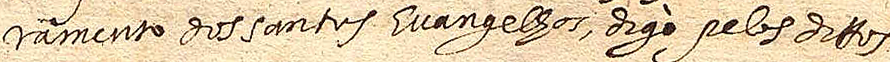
ramento dos santos Euangelhos, digo pelos dittos
